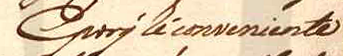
E porq̄ hé conveniente
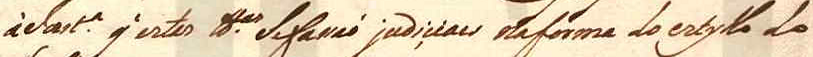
à Iust.a q̄ estas tt.as Se fassaõ judiçiaes na forma do estyllo do
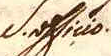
S. offiçio.
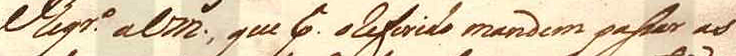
Reqr.o a VM̄., que p.a o Referido mandem passar as
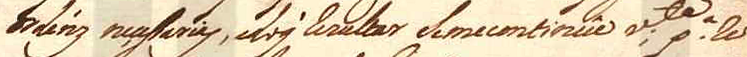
ordens neçessarias, e do q̄ Rezultar Se me continûe v.ta; p.a Re
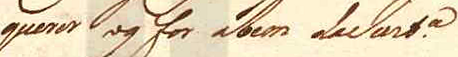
querer o q for a bem de Iust.a
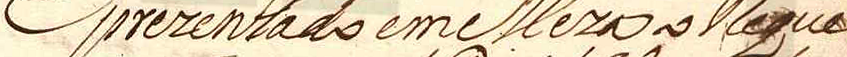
E prezentando em Meza o Reque
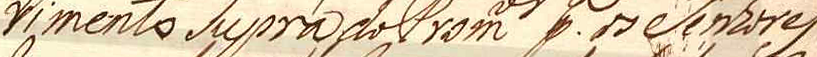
rimento suprá do Prom.or p.a os Senhores
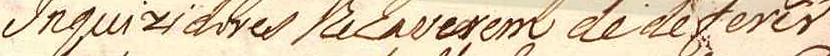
Inquizidores lhe haverem de deferir
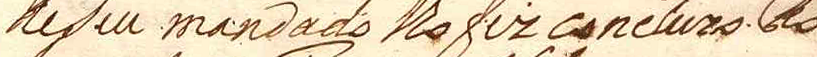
de seu mandado lho fiz concluzo Ro
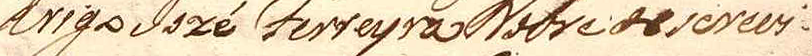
drigo Iozé Ferreyra Nobre o escrevi
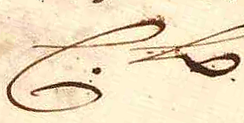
C.lo
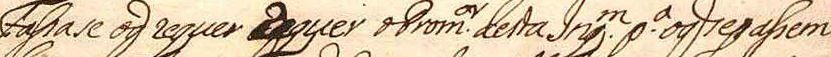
Fassa se o q̄ requer e quer o Prom.or desta Inq.m p.a o q̄ se passem
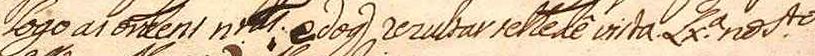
logo as ordens nr.as e do q̄ Rezultar se lhe dê vista. Lx.a no s.to
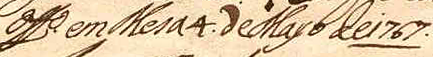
offo. em Mesa 4. de Mayo de i767.
